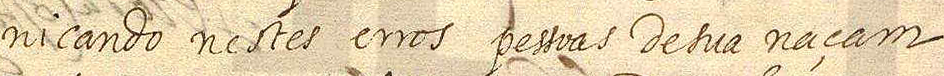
nicando nestes erros pessoas de sua naçam
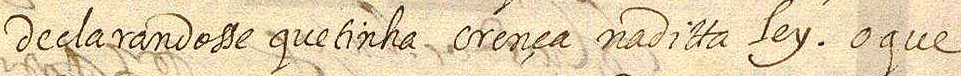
declarandosse que tinha crença na ditta Ley. o que
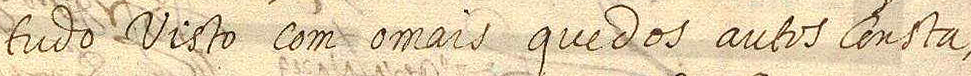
tudo visto com o mais que dos autos consta,
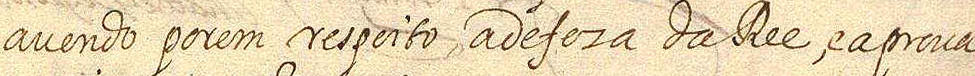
auendo porem respeito, a defeza da Ree, e a proua
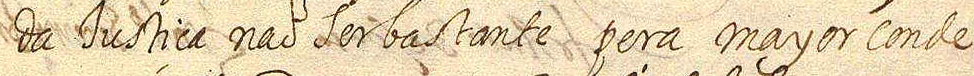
da Iustiça naõ ser bastante pera mayor conde
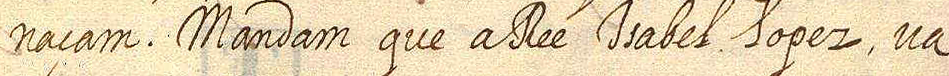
naçam. Mandam que a Ree Isabel Lopez, ua
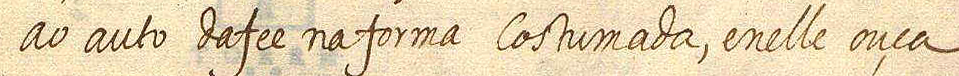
ao auto da fee na forma Costumada, e nelle ouça
